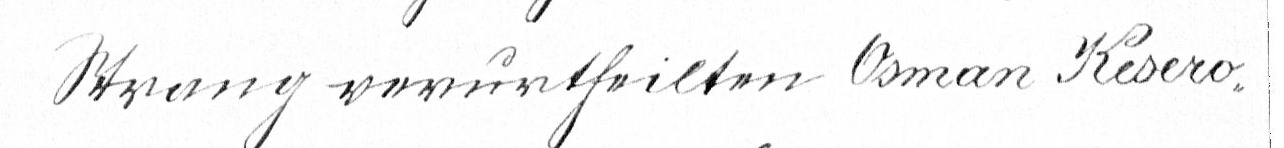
Strang verurtheilten Osman Kesero¬
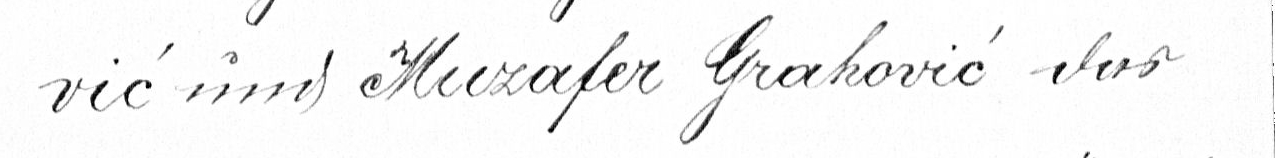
vić und Muzafer Grahović das
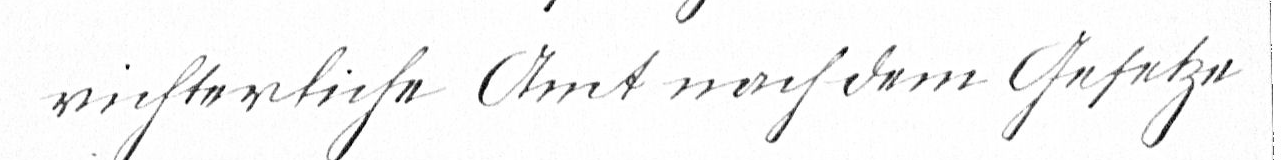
richterliche Amt nach dem Gesetze
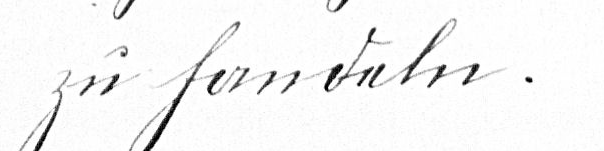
zu handeln.
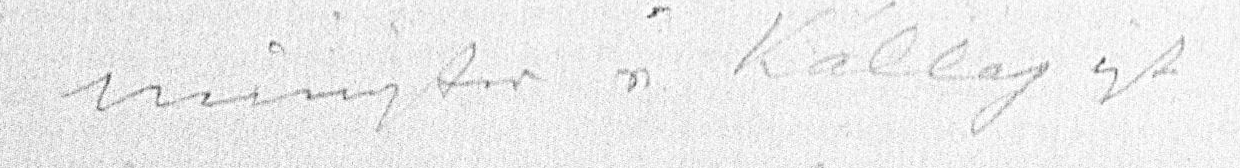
minster u. Kállay ist
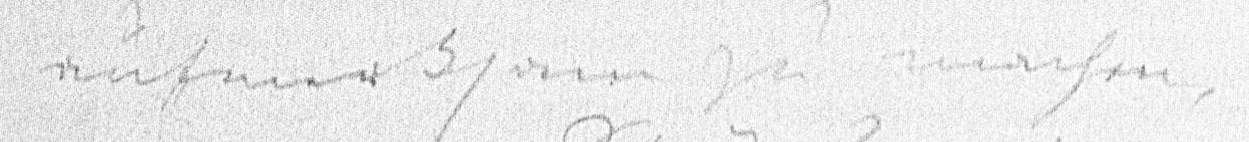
aufmerksam zu machen,
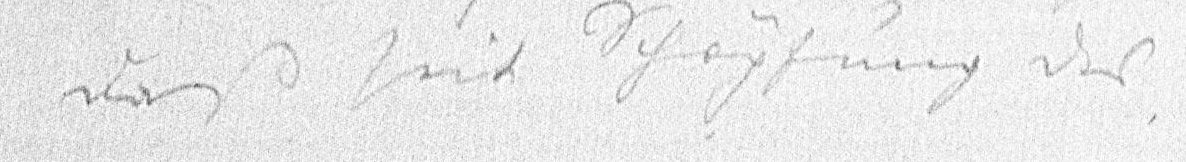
daß seit Schöpfung des
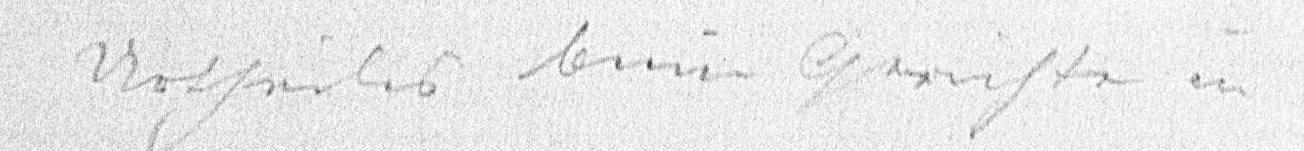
Urtheiles beim Gerichte in
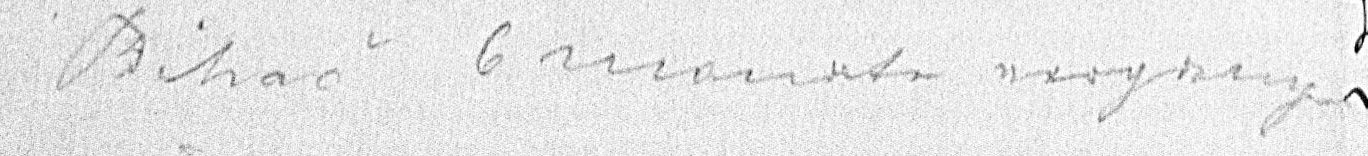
Bihać 6 monate vergangxx
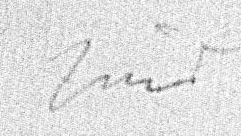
sind
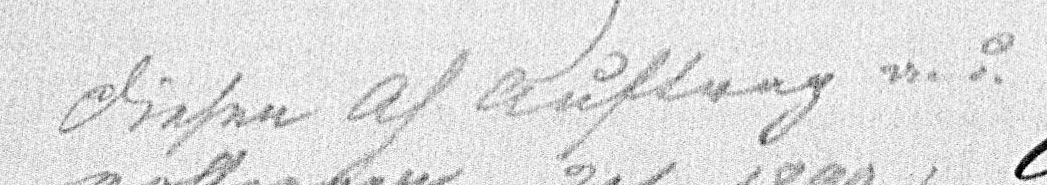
Diesen Ah Auftrag a. xx
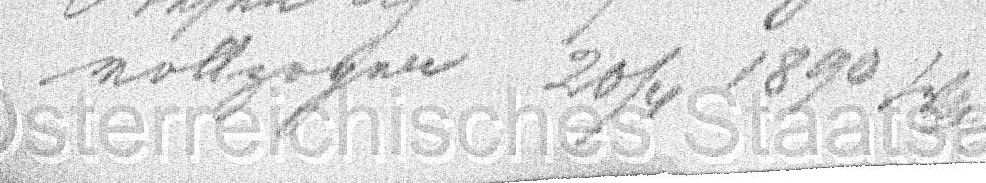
vollzogen 20/4 1890 xx
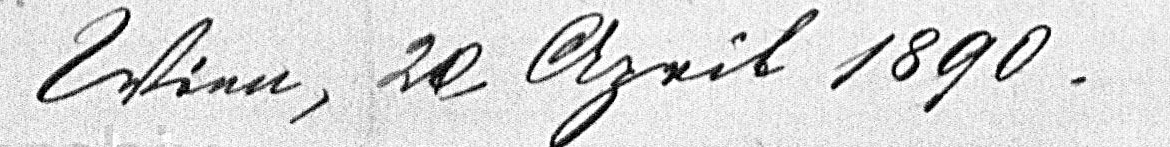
Wien, 20 April 1890.
